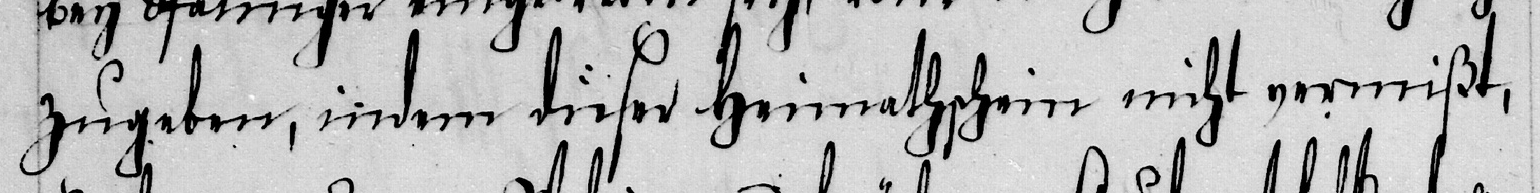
zugeben, indem dieser Heimathschein nicht vermißt,
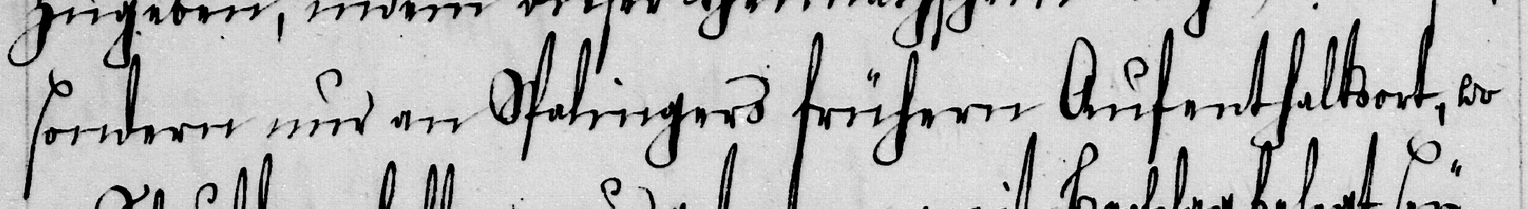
sondern nur an Spalingers frühern Aufenthaltsort, wo
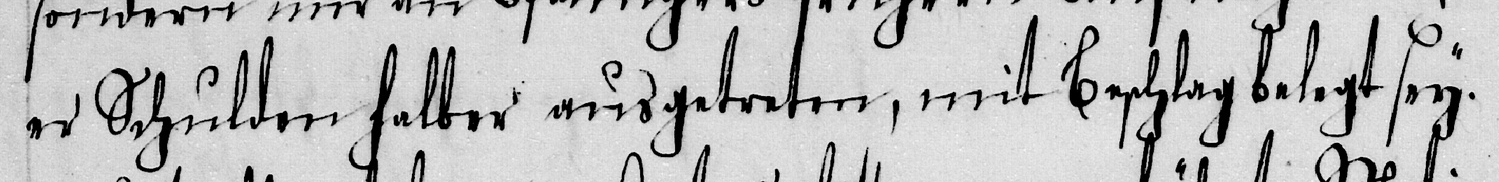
er Schulden halber ausgetreten, mit Beschlag belegt sey.
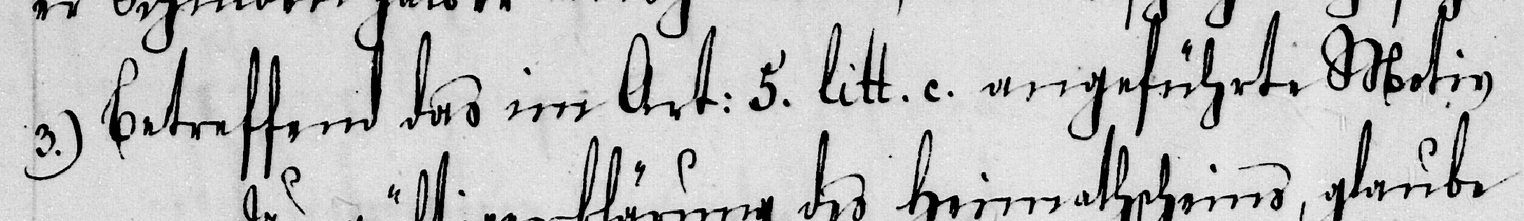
3.) Betreffend das in Art: 5. litt. c. angeführte Motiv
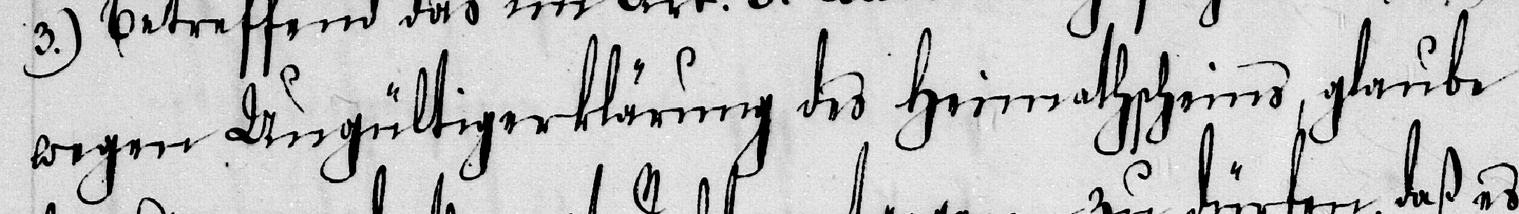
wegen Ungültigerklärung des Heimathscheins, glaube
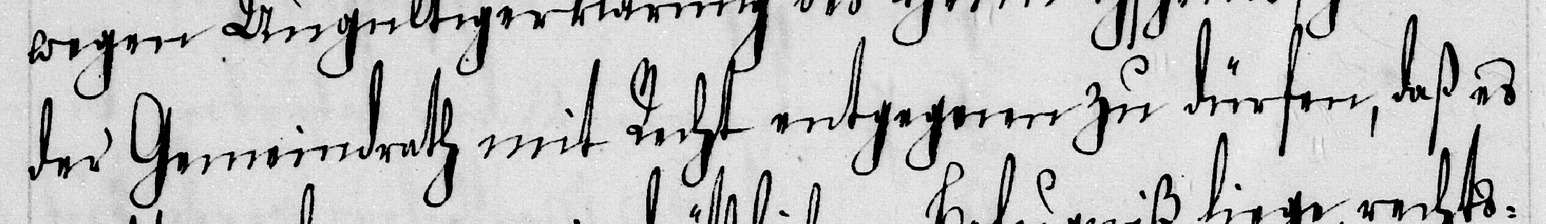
der Gemeindrath mit Recht entgegnen zu dürfen, daß es
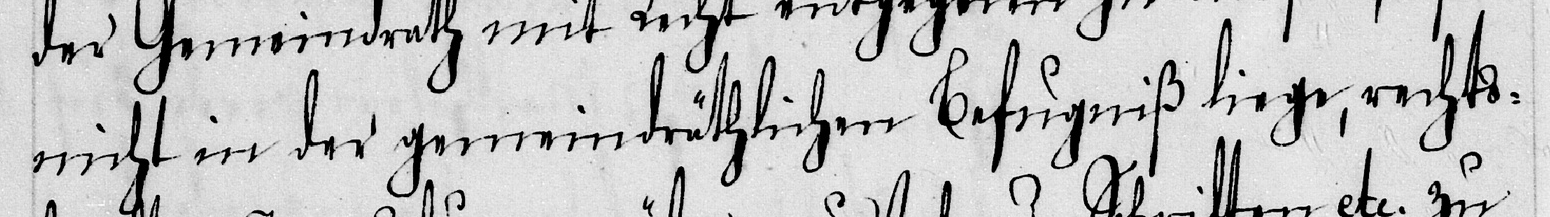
nicht in der gemeindräthlichen Befugniß liege, rechts¬
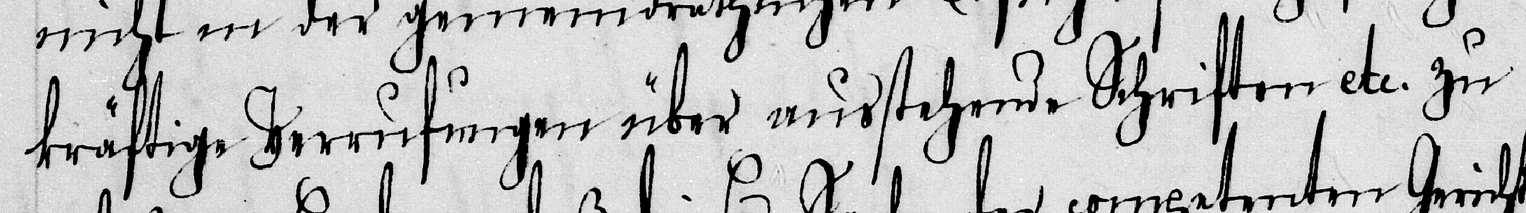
kräftige Verrufungen über ausstehende Schriften etc. zu
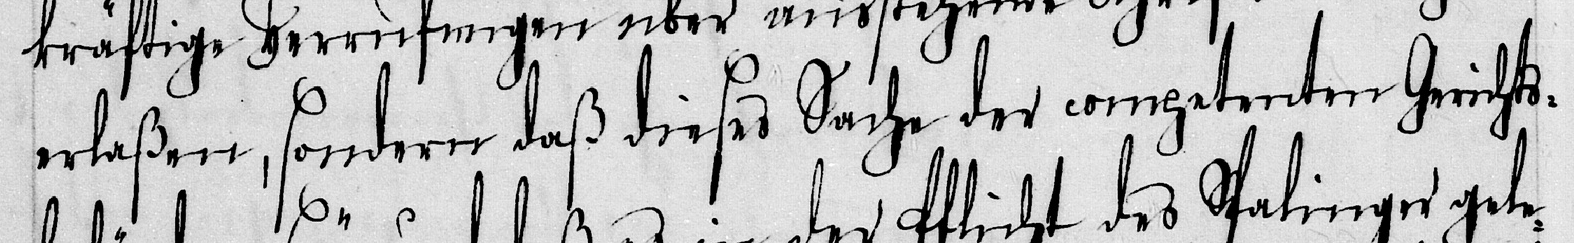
erlaßen, sondern daß dieses Sache der competenten Gericht¬
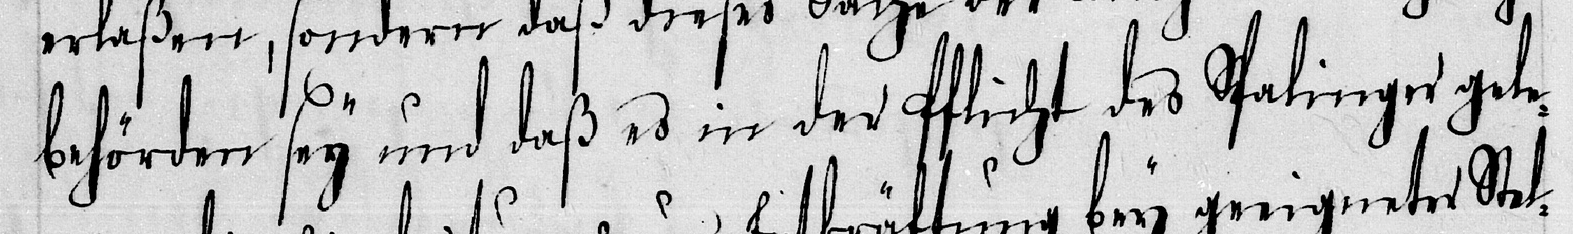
sbehörden sey und daß es in der Pflicht des Spalinger gel¬
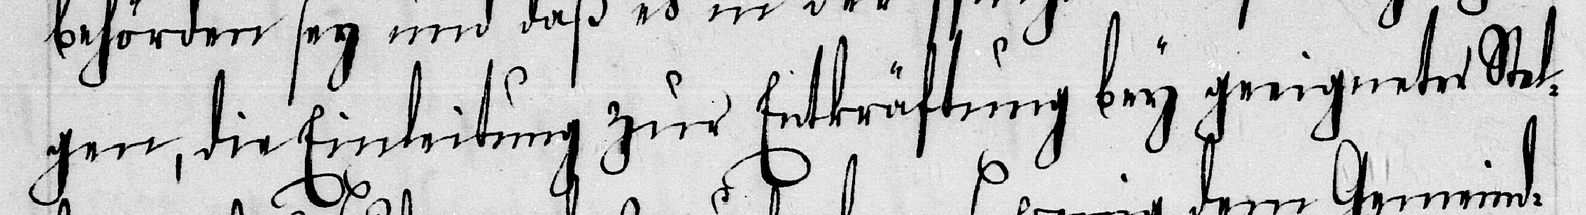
egen, die Einleitung zur Entkräftung bey geeigneter Stel¬
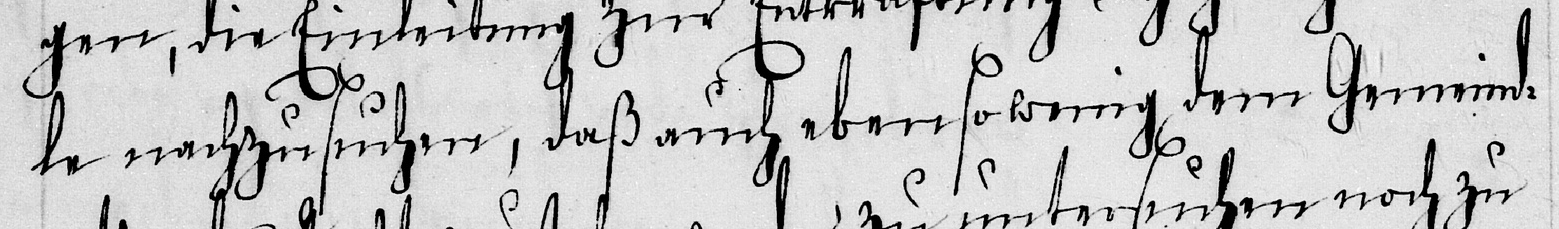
le nachzusuchen, daß auch ebensowenig dem Gemeind¬
